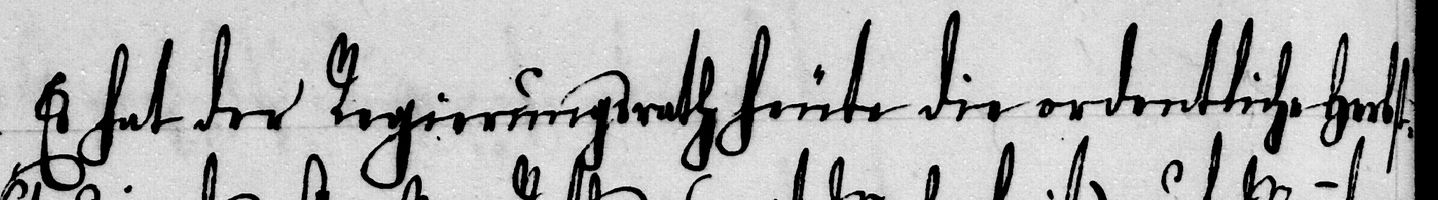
Es hat der Regierungsrath heute die ordentliche Her¬
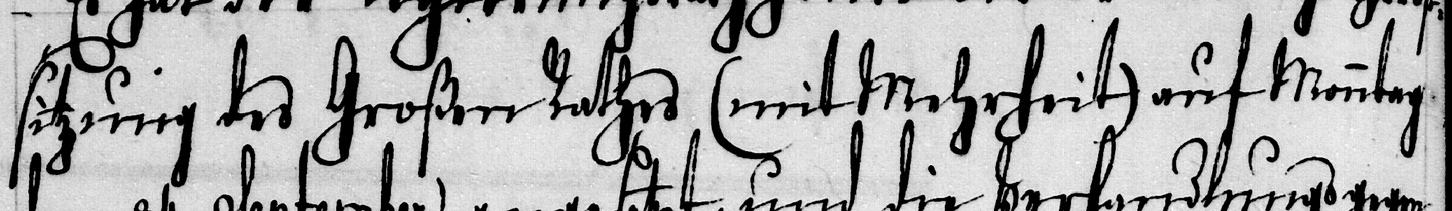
itzung des Großen Rathes (mit Mehrheit) auf Monntag
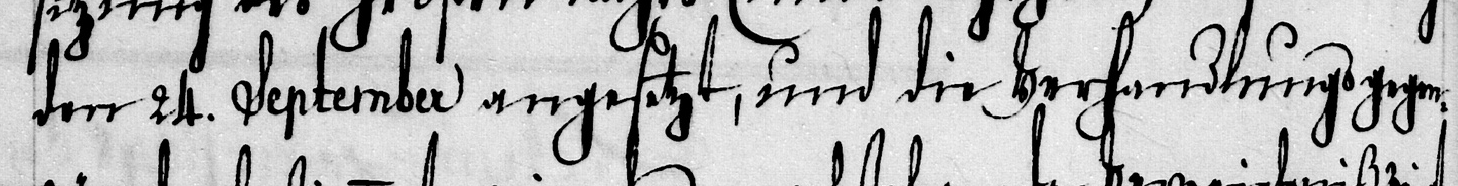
den 24. September angesetzt, und die Verhandlungsgegen¬
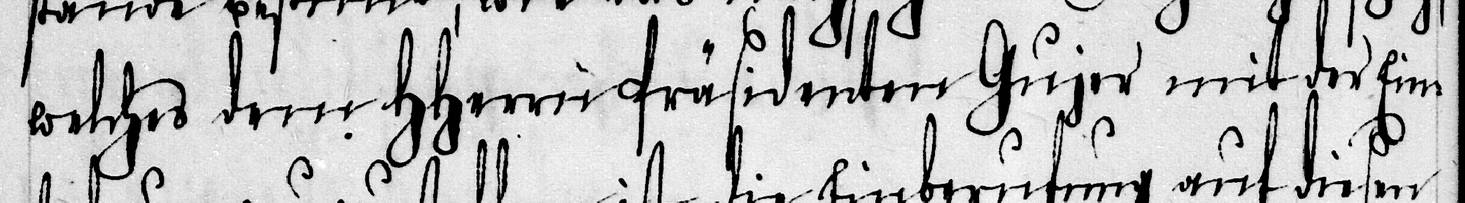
welches dem HHerrn Präsidenten Gujer mit der Ein¬
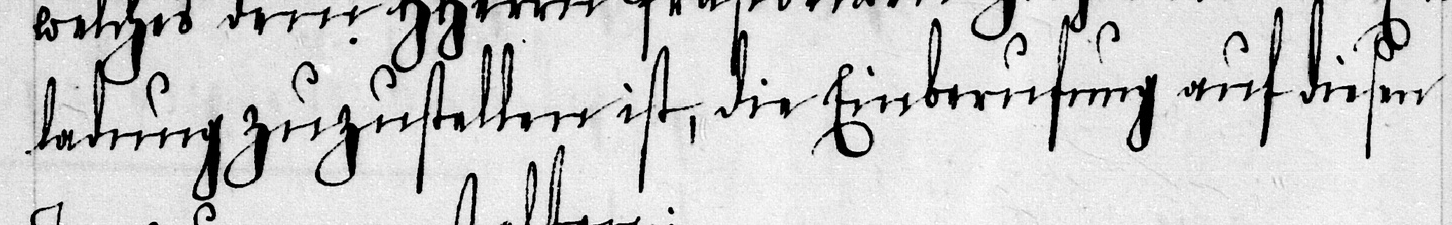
ladung zuzustellen ist, die Einberufung auf diesen
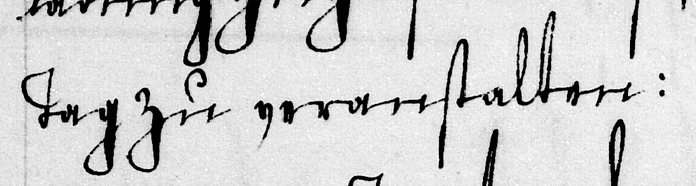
Tag zu veranstalten:
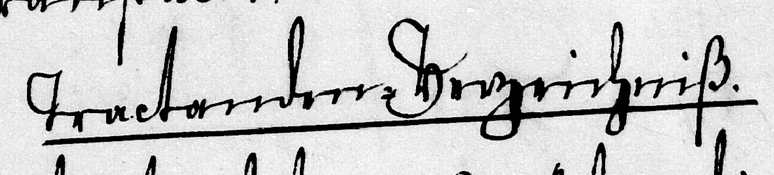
Tractanden Verzeichniß.
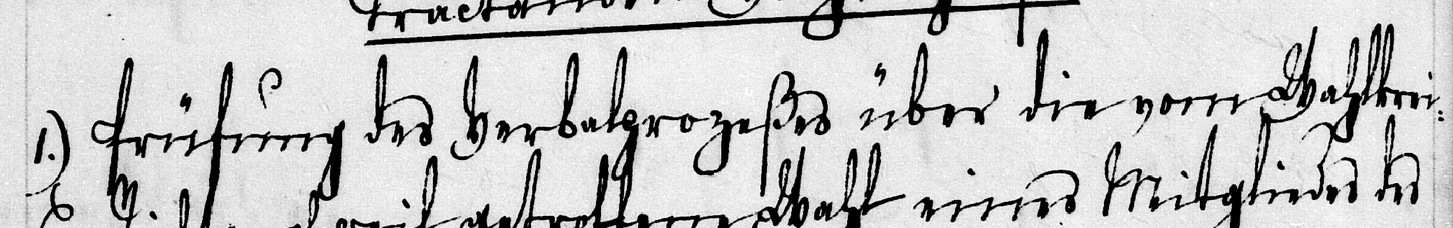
1.) Prüfung des Verbalprozeßes über die vom Wahlkre¬
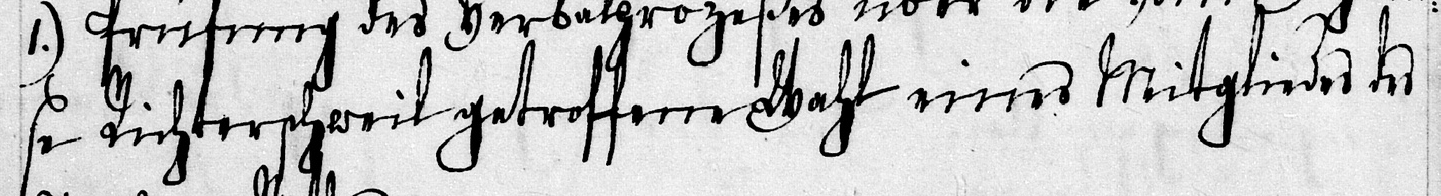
ise Richterschweil getroffene Wahl eines Mitgliedes des
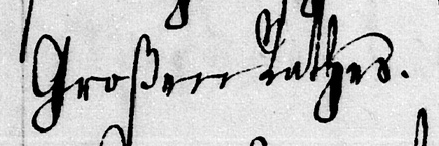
Großen Rathes.
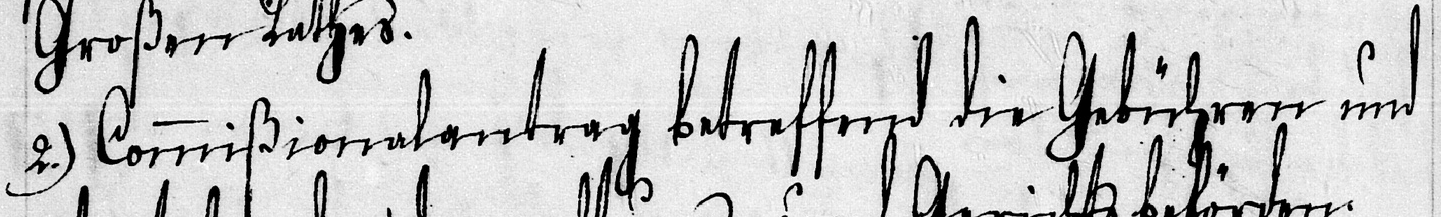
2.) Commißionalantrag betreffend die Gebühren und
